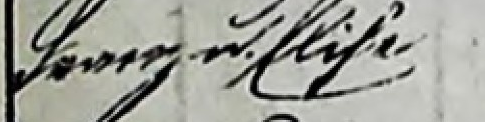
Franz u. Elise
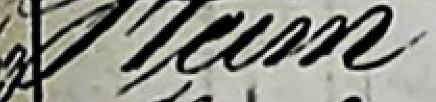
Heim
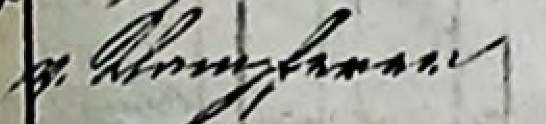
v. Klampferer
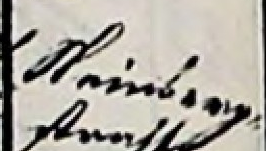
Steinberg„
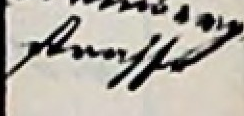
strasse
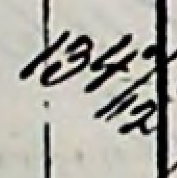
1347,2
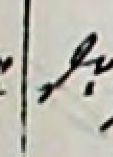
Do
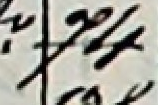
74
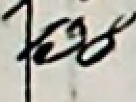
138
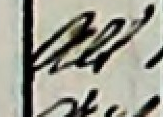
Alt
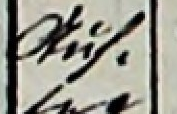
Aus„
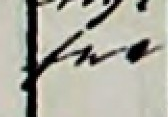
see
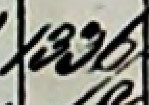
1336/a
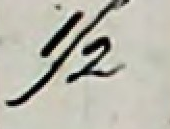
1/2
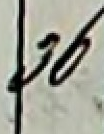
36
